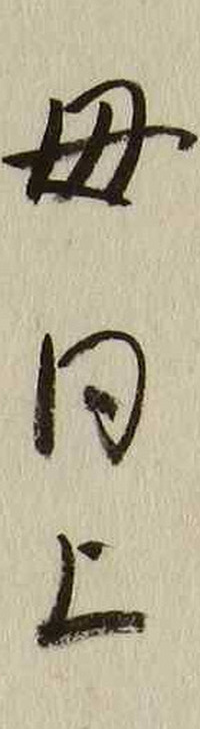母同上
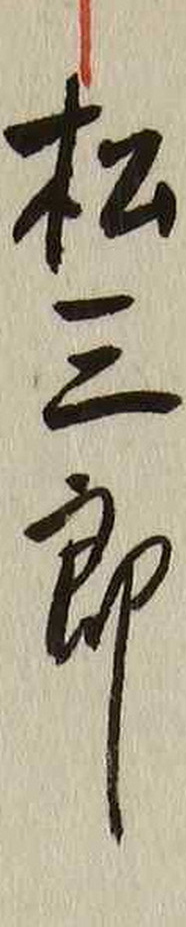松三郎
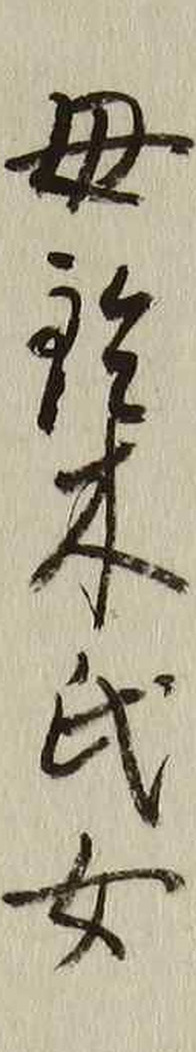母鈴木氏女
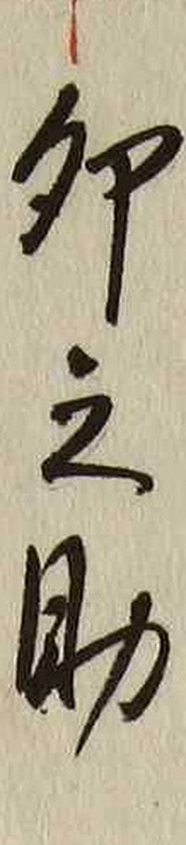卯之助
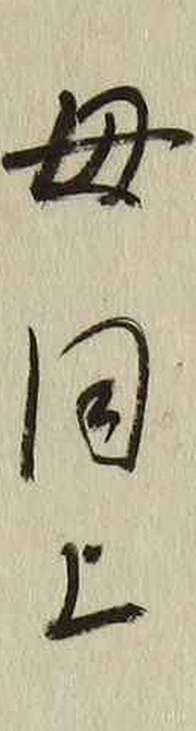母同上
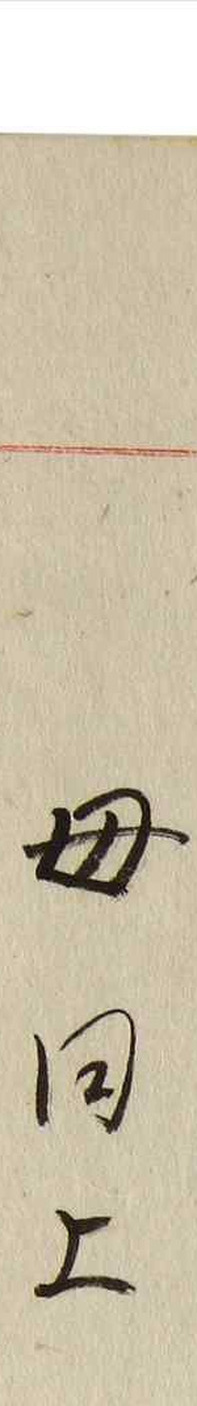母同上
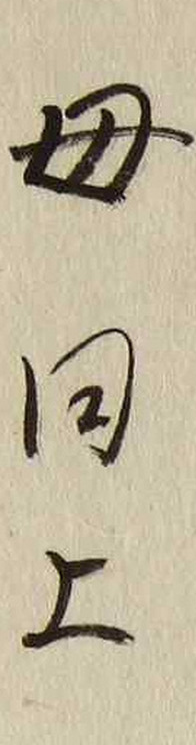母同上
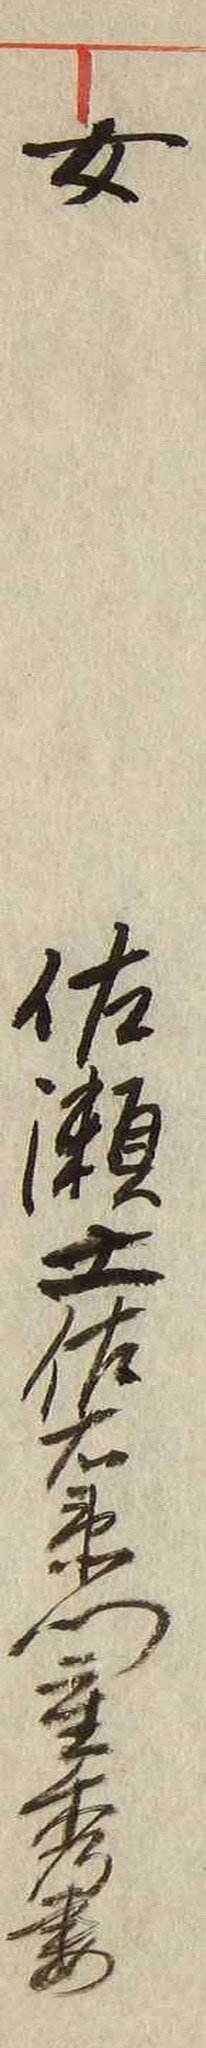女佐瀬士佐右衛門重秀妻
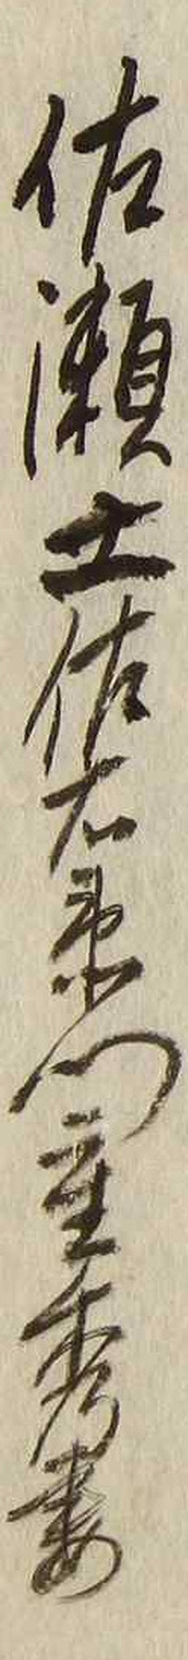女佐瀬士佐右衛門重秀妻

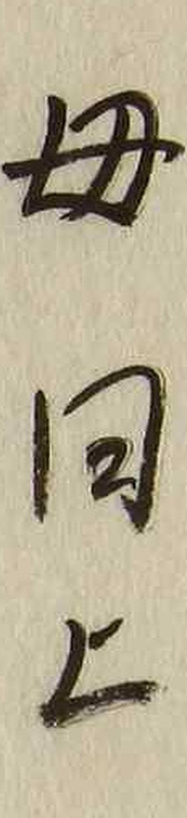母同上
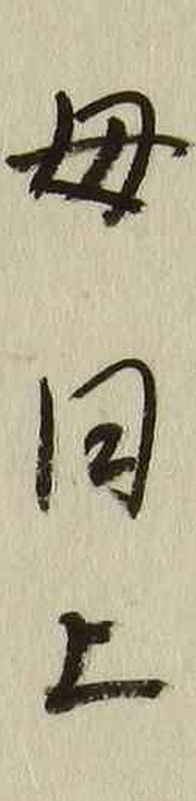母同上
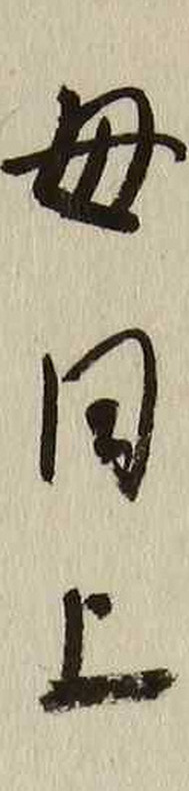母同上
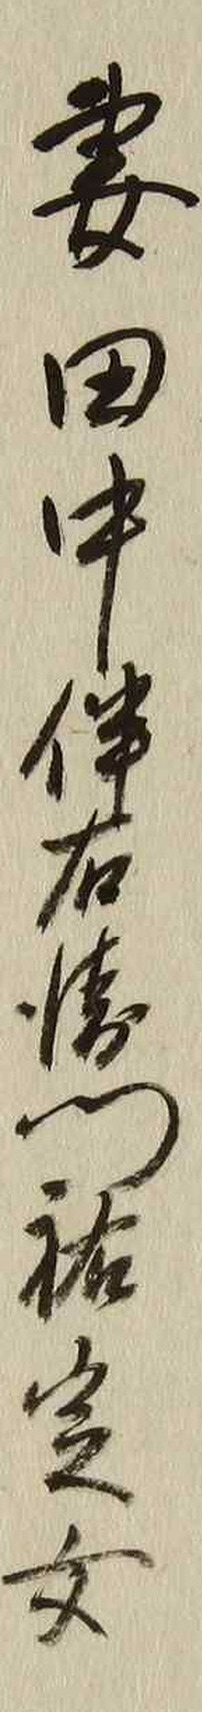妻田中伴右衛門祐定女
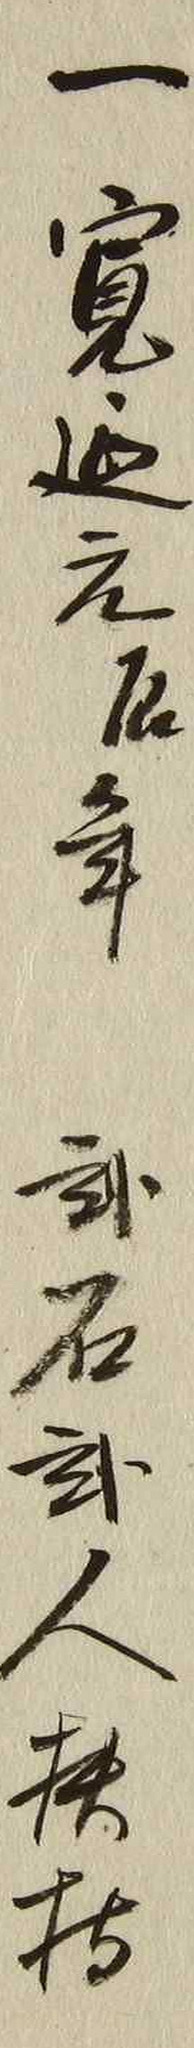一寛延元辰年弐石弐人扶持
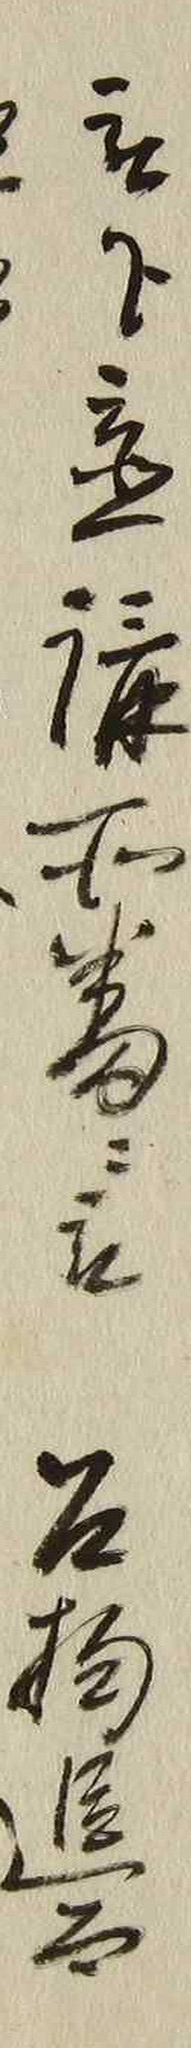被下置講所番ニ被召抱追而
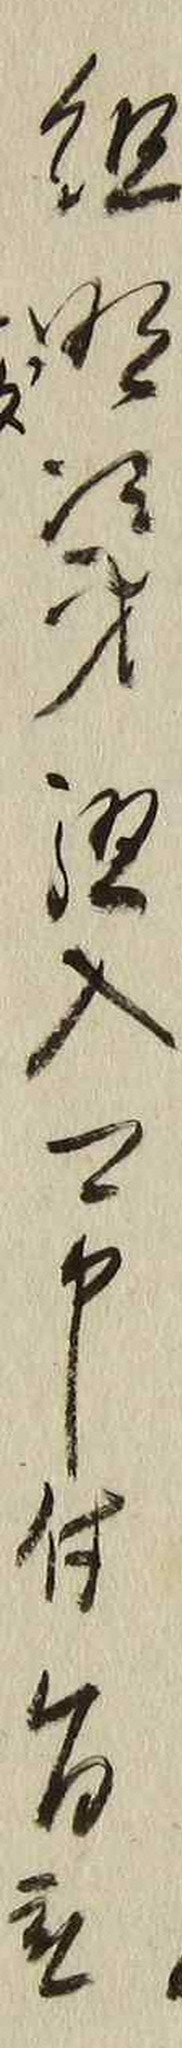組明次第組入可申付旨被
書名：諸士系譜　巻之353　す之部3
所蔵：会津若松市立会津図書館
